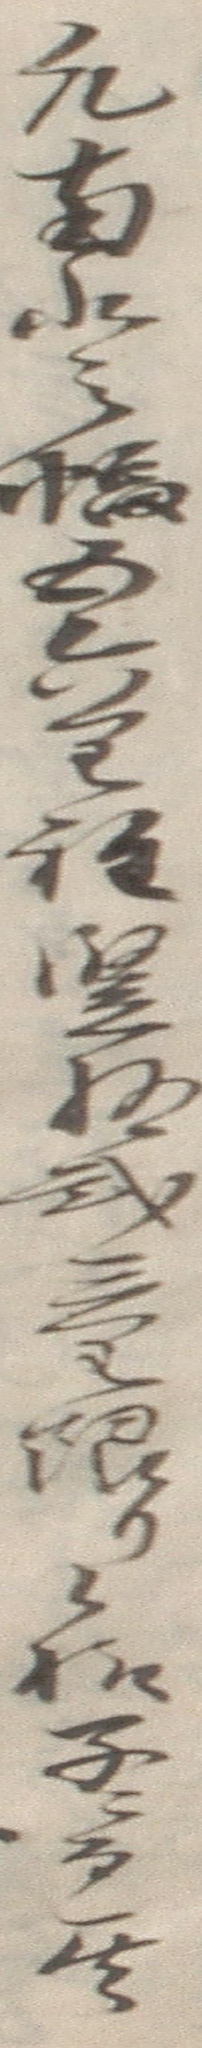凡南北之幅五六里程竪拾弐三里限り候様子二而其
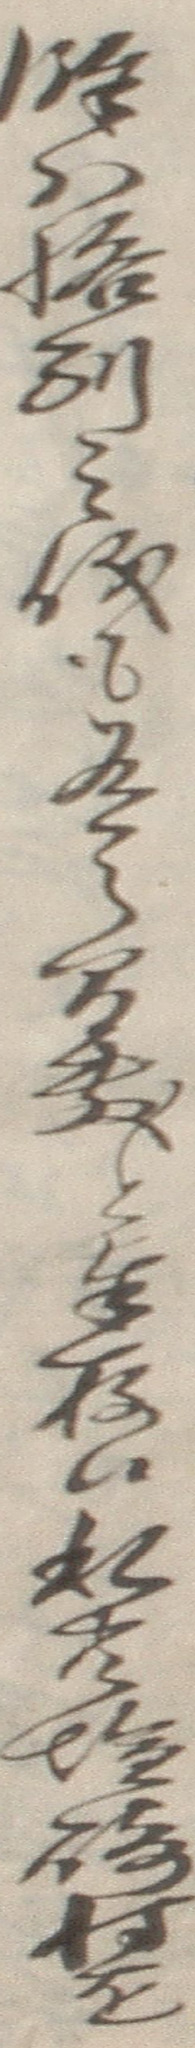餘ハ格別之儀も有之間敷と奉存候私共塩崎村を
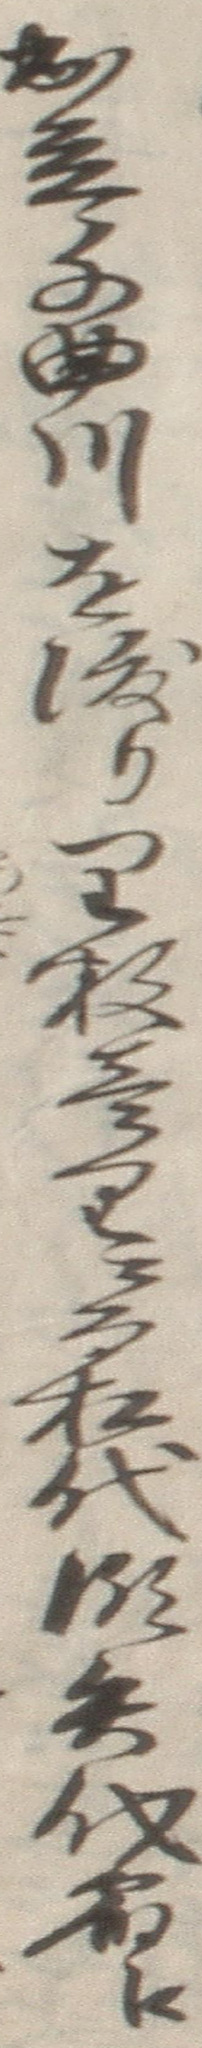出立千曲川を渡り里数壱里二而松代領矢代宿江
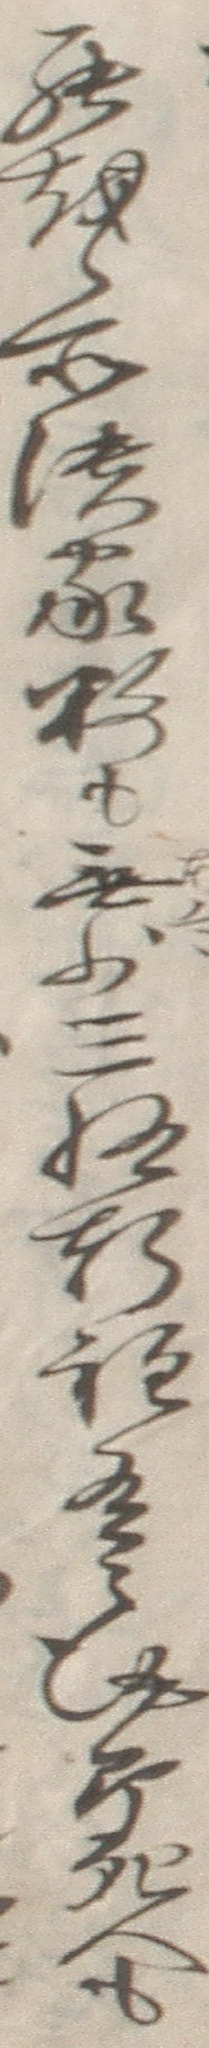罷越候所潰家数も無少三拾軒程有之趣即死人も
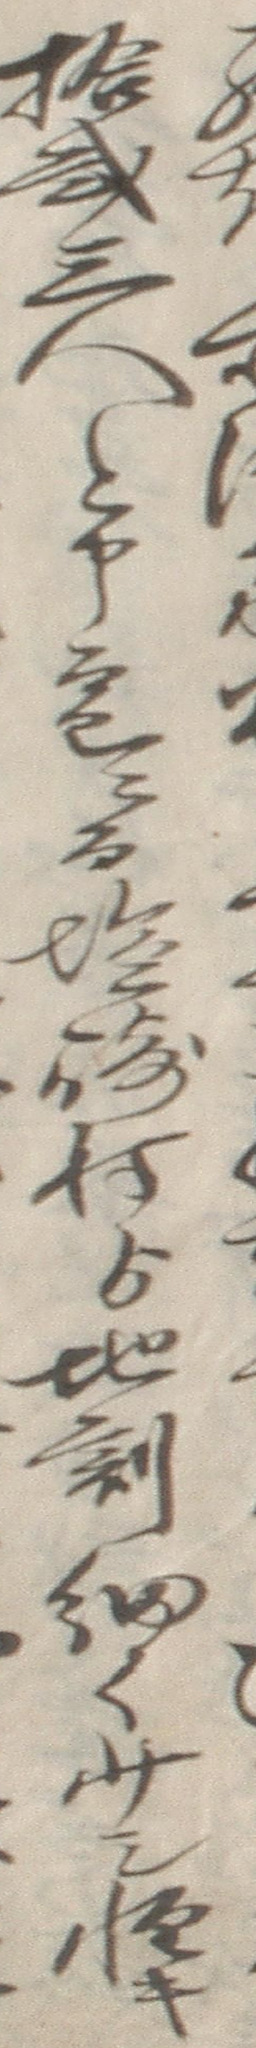拾弐三人と申而巳二而塩崎村ゟ地割細く少ㇱ軽キ
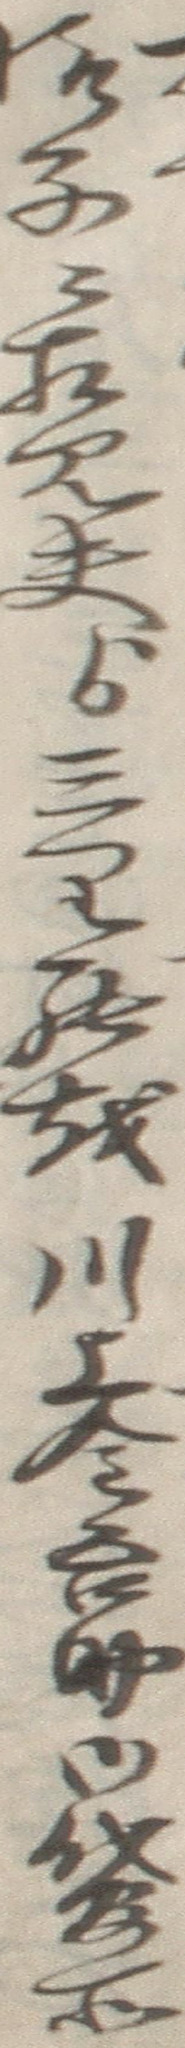様子二相見夫ゟ三里罷越川上金吾助御代官所
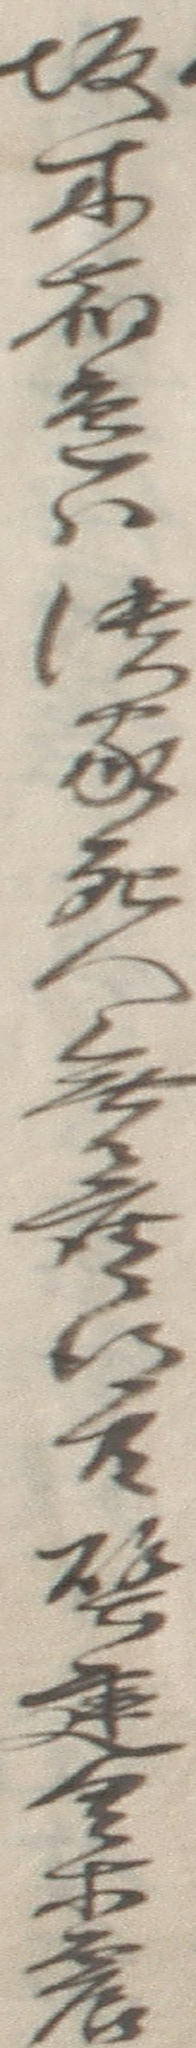坂木宿辺ハ潰家死人無御座候得共壁建具等震

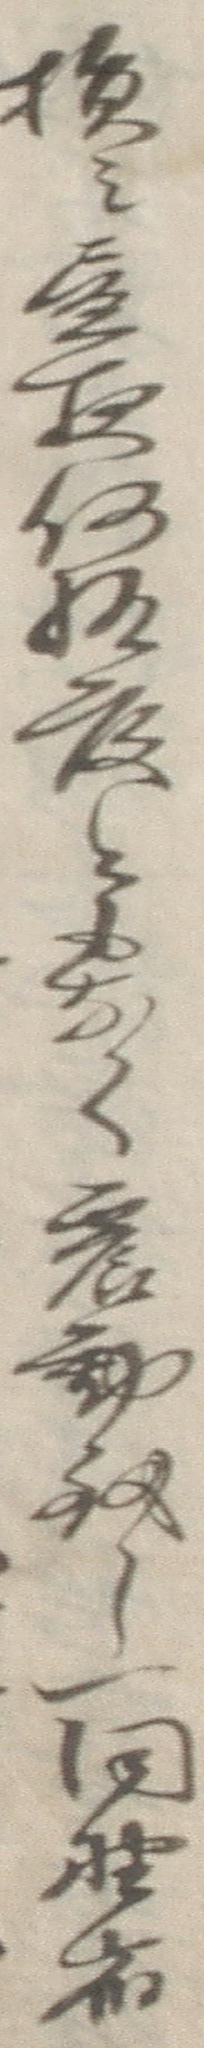損ㇱ昼夜何拾度ともなく震動致し一同野宿
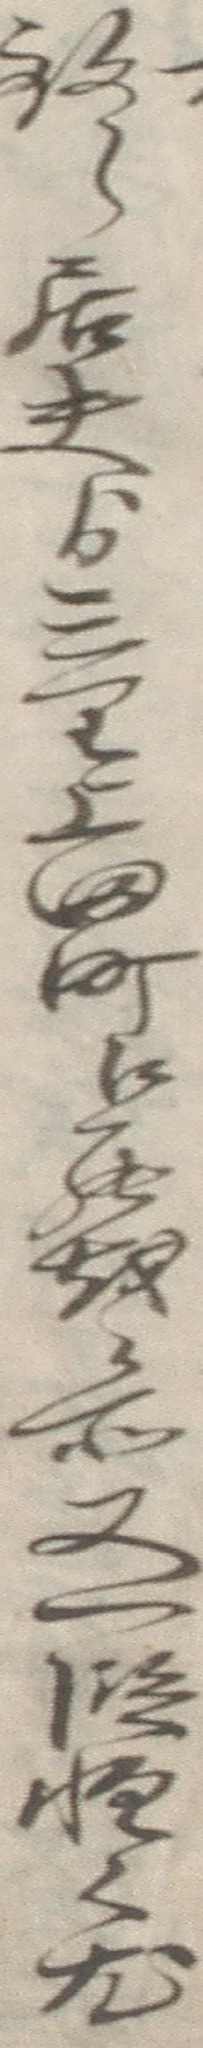致し居夫ゟ三里上田町江罷越候所又一段軽く尤
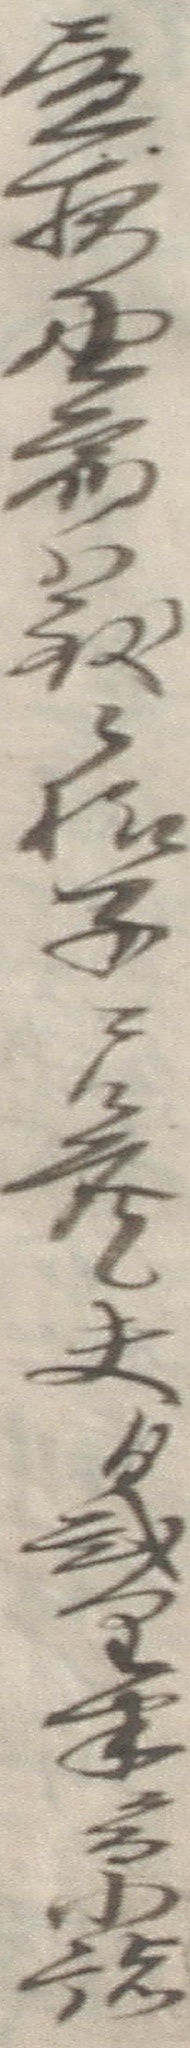昼夜野宿ハ致候様子二御座候夫ゟ弐里半二而小諸
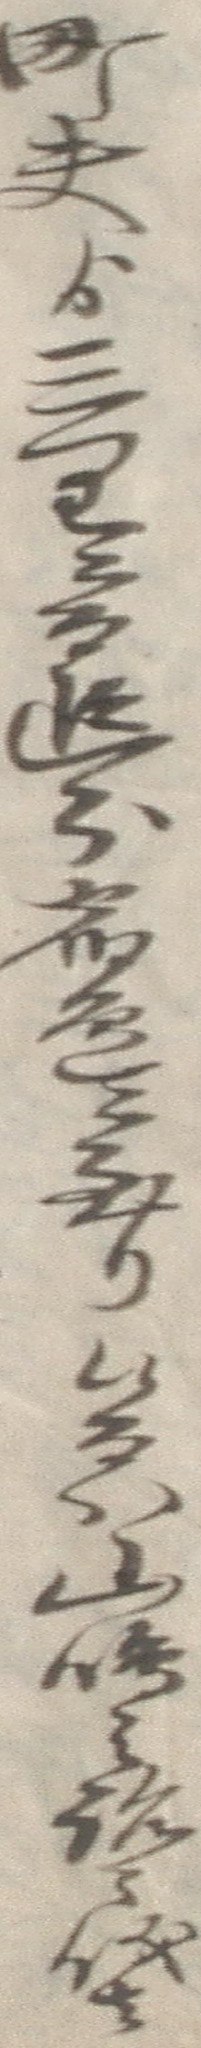町夫ゟ三里二而追分宿辺二至り候而ハ山鳴之続之儀は
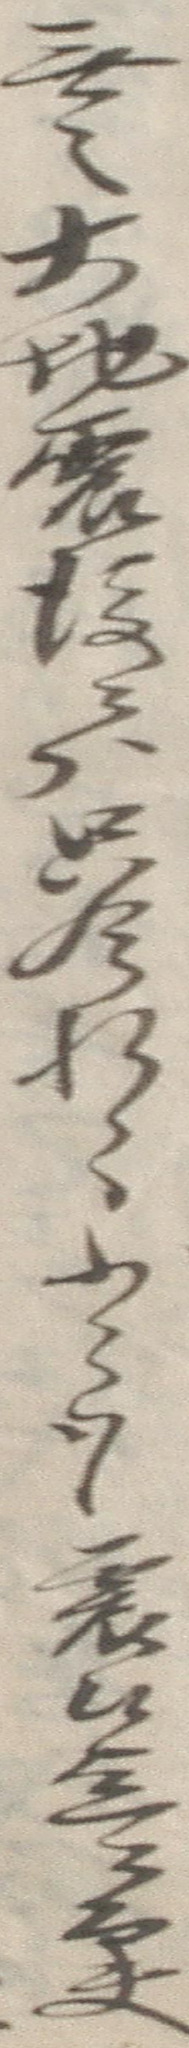無之大地震後二ハ只今折々少々ツゝ震候迄二而夫
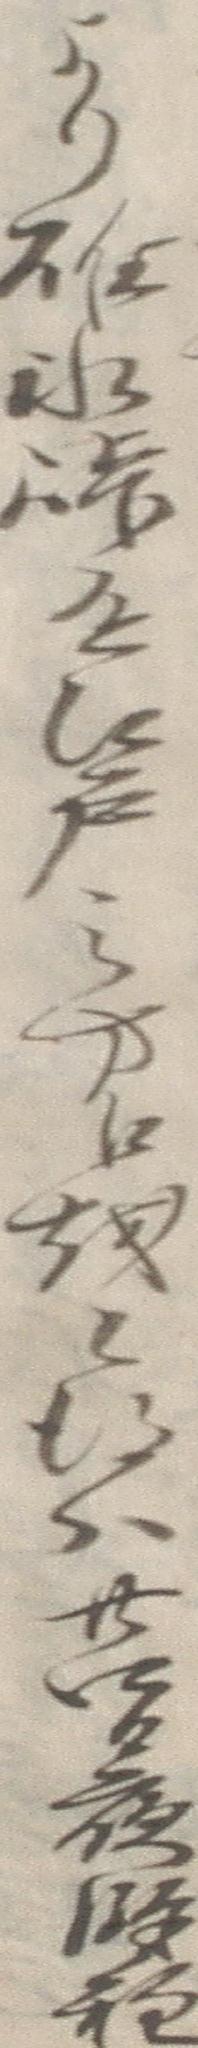より碓氷峠を江戸之方江越候得ハ廿四日夜餘程
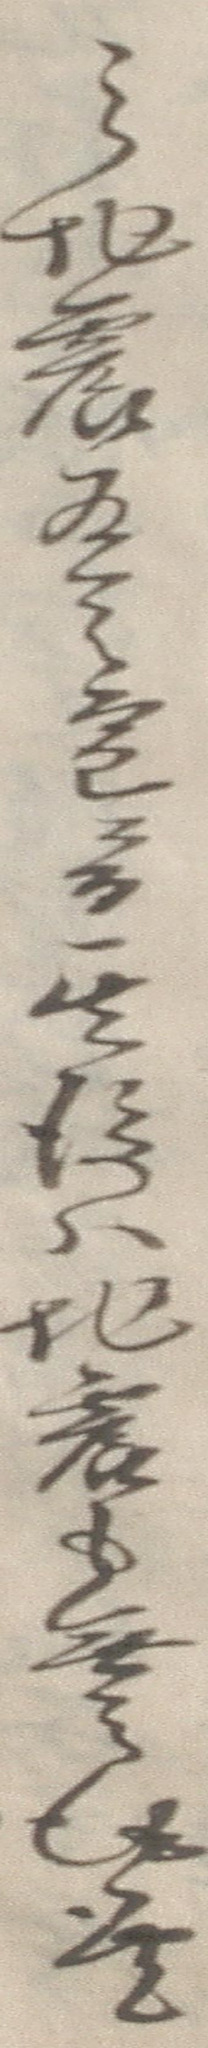之地震有之而巳二而其後ハ地震も無之趣御座候
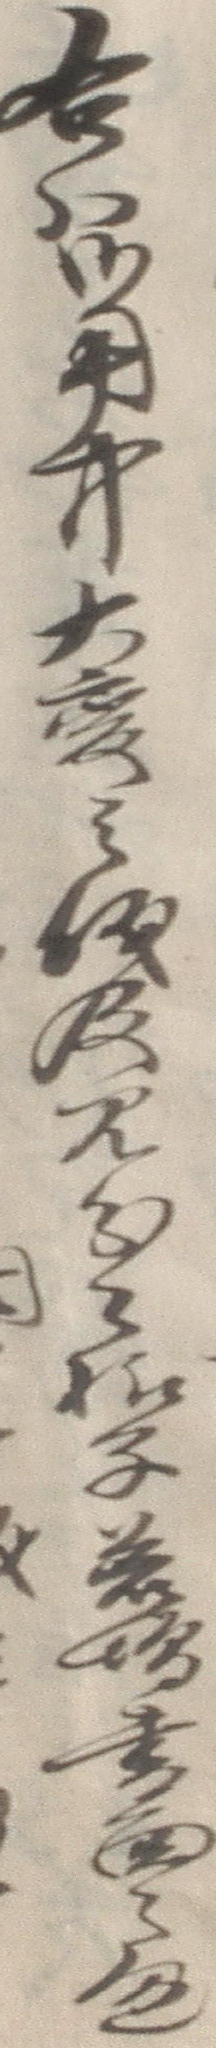右ハ御用中大変之儀及見分候様子荒増書面之通
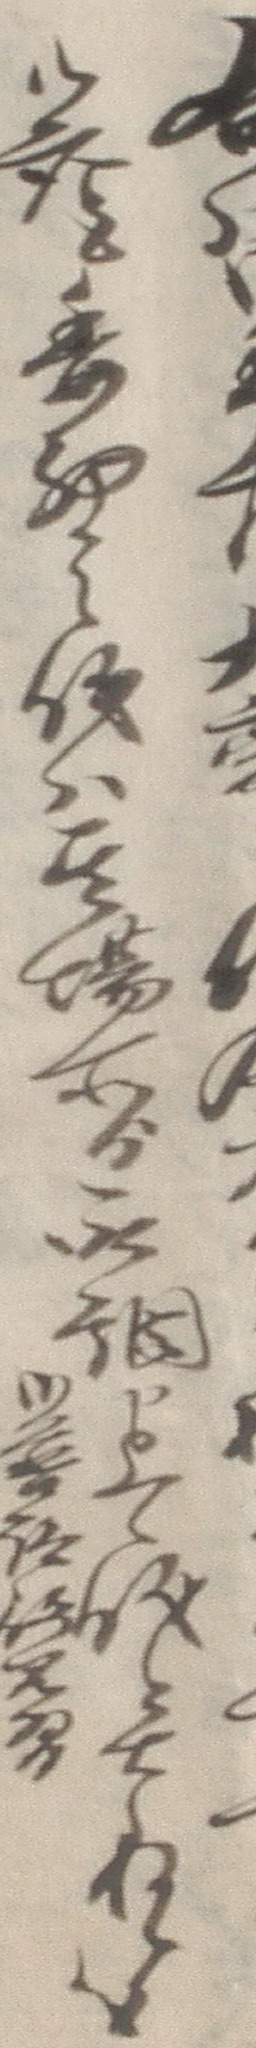御座候委細之儀ハ其場所ゟ取調申上候儀二御座候以上
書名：信州地震一件
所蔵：東京大学地震研究所図書室 Earthquake Research Institute Library, The University of Tokyo, JAPAN
